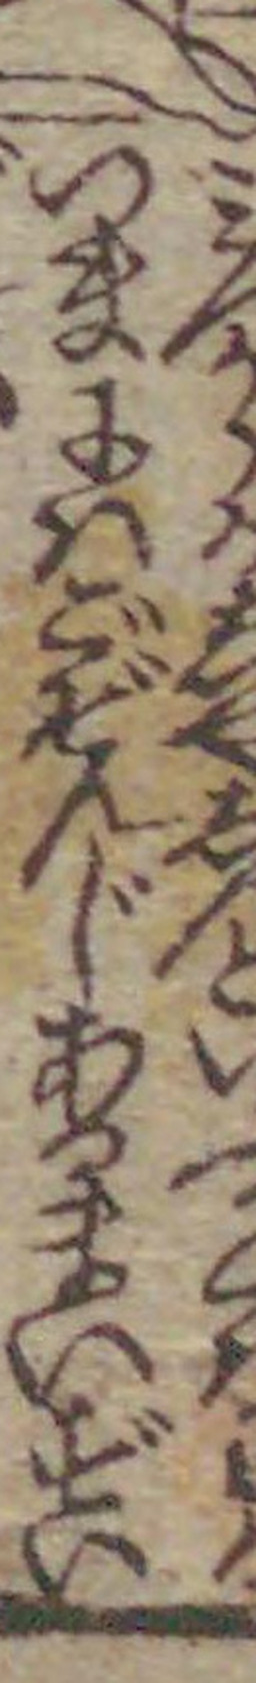つまにはごぞんじあるまいずい
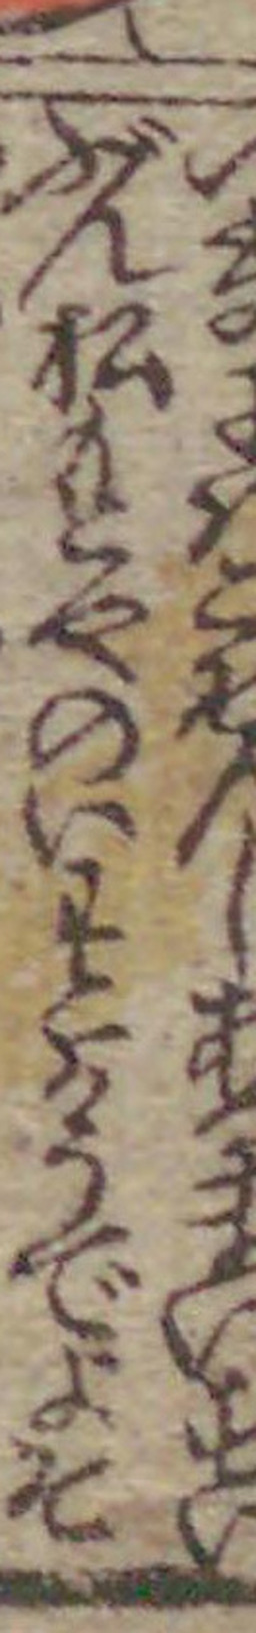ぶん松もとやのいわとかうでよそ
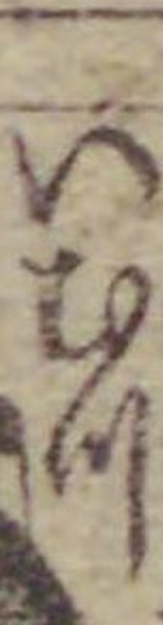いむつ
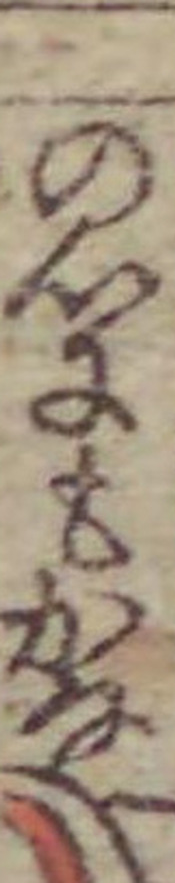の心にもかな
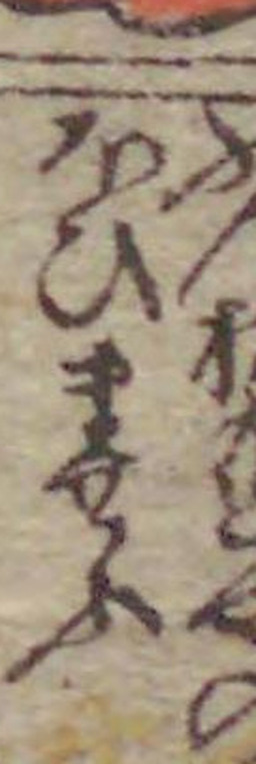ほひませふ
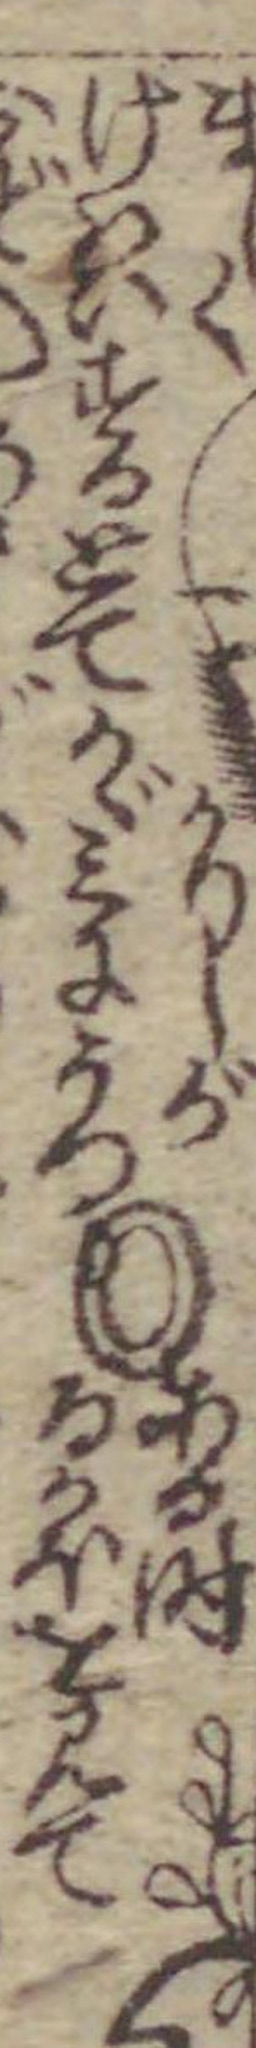けはいするとてかゞみにうつるかほを見て
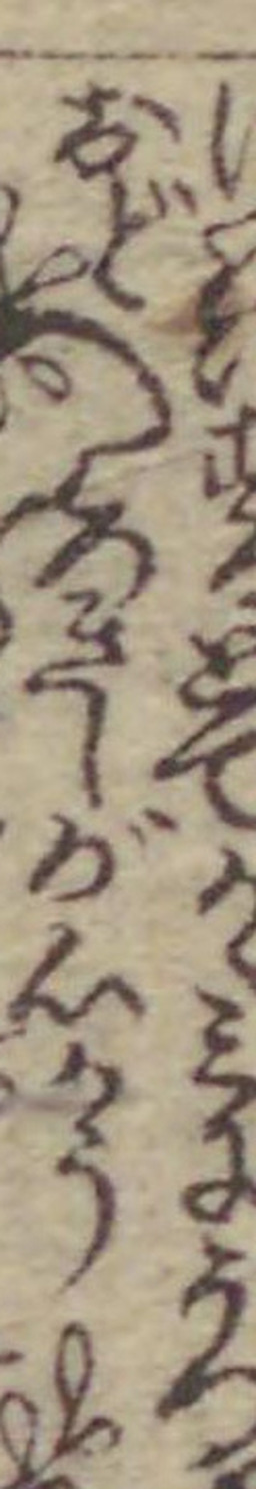おどろきしが心かう
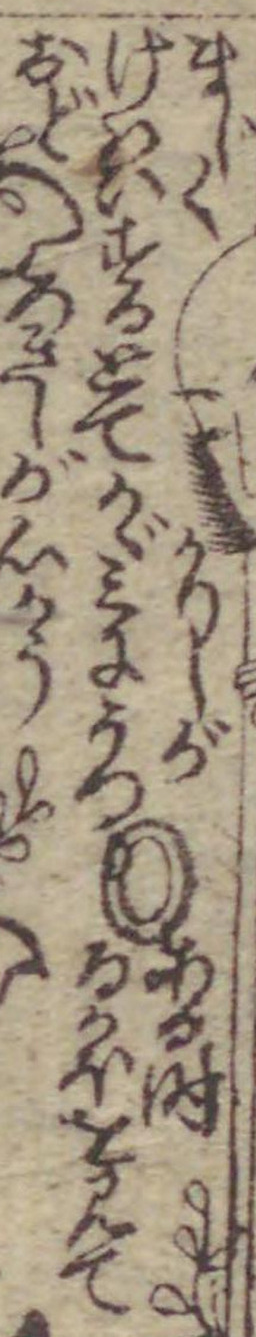けはいするとてかゞみにうつるかほを見て
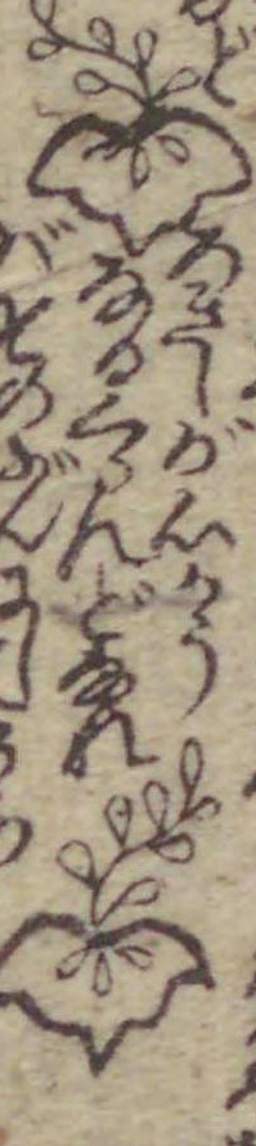なるくらんどなれ
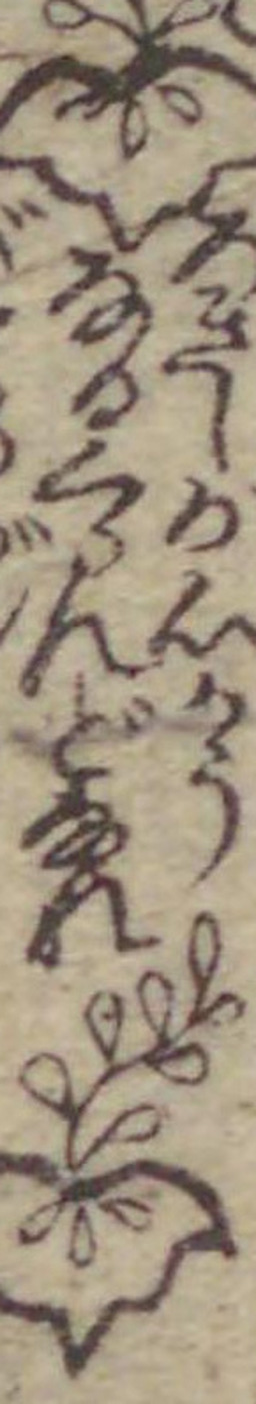なるくらんどなれ
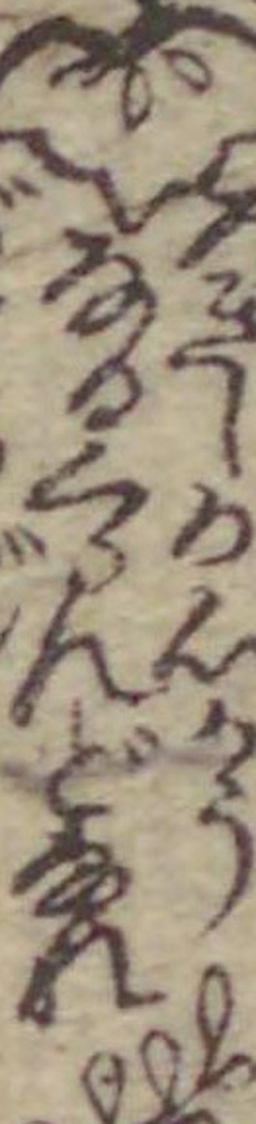なるくらんどなれ
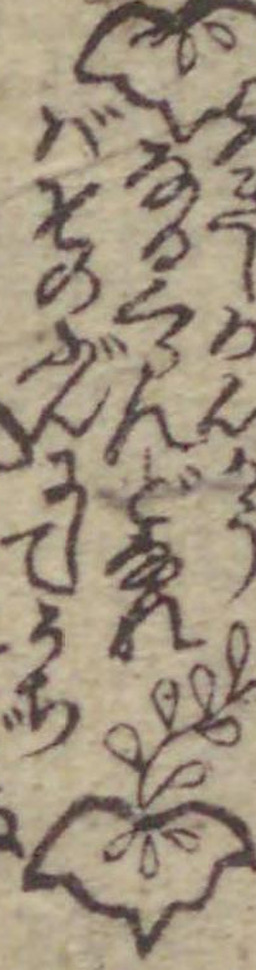ばそのぶんにしてうち
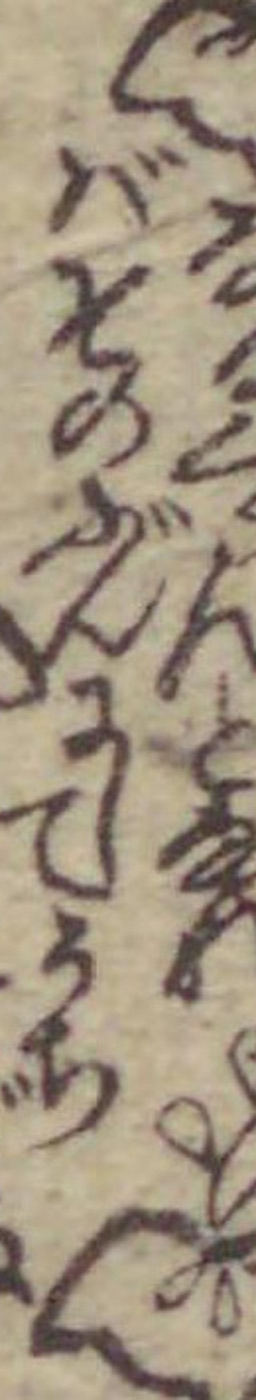ばそのぶんにしてうち
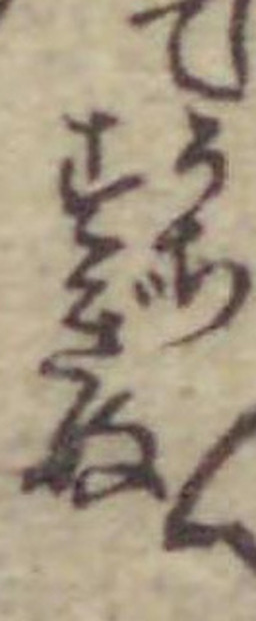すぎぬ
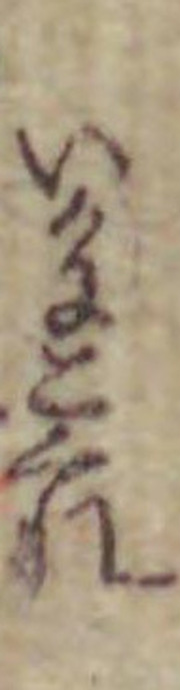いかにこくれ
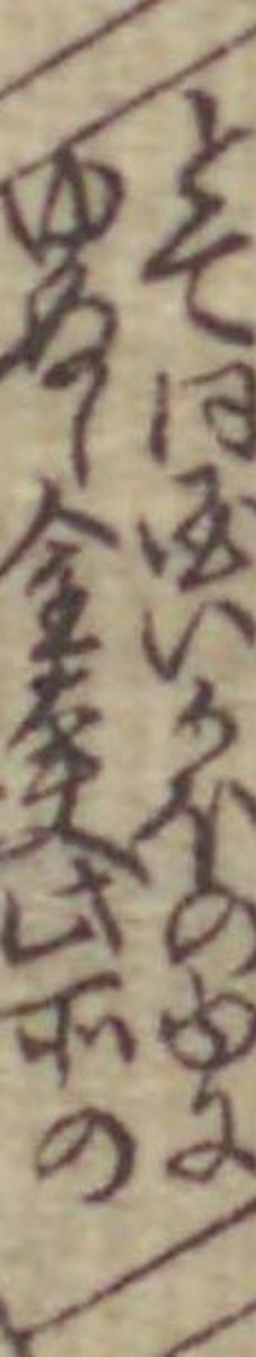ゆぬし金太夫此所の
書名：娜二代鉢木 5巻
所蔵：国立国会図書館 National Diet Library, JAPAN
